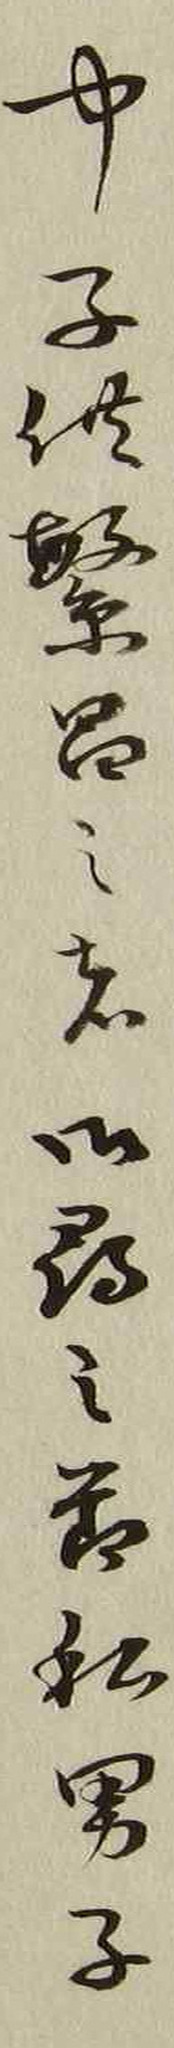中子供繁昌之者御尋ね之節私男子
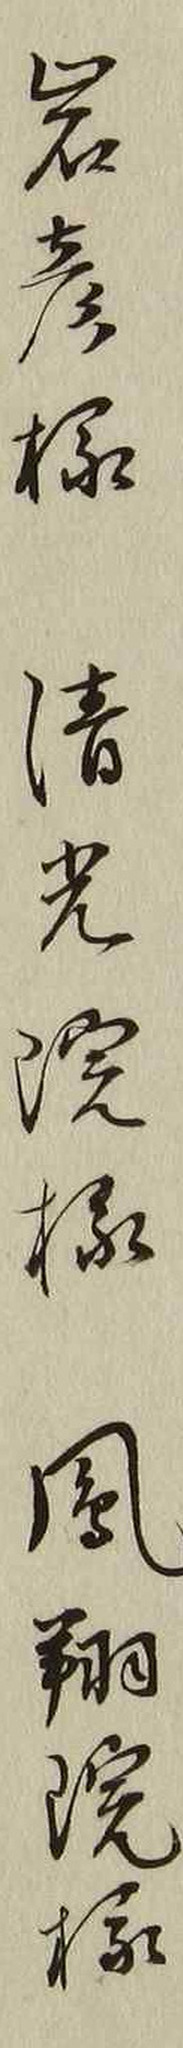岩彦様清光院様鳳翔院様
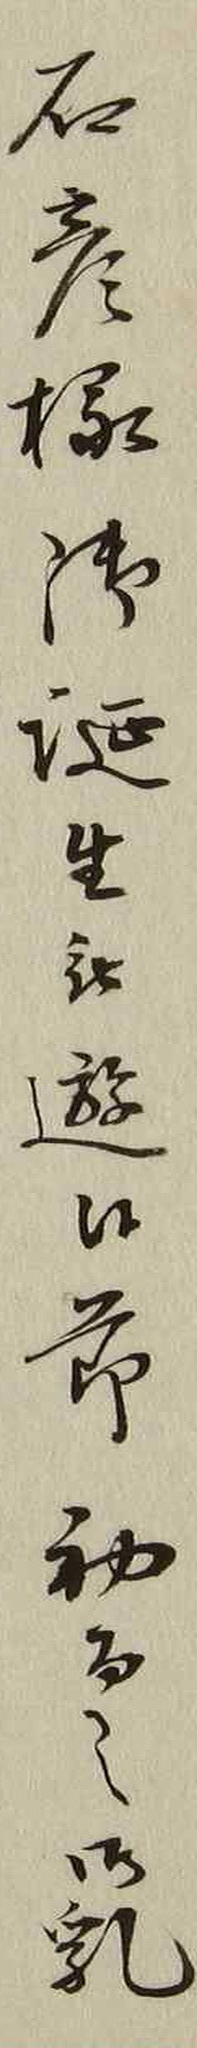石彦様御誕遊ばされ候節初めて之御乳
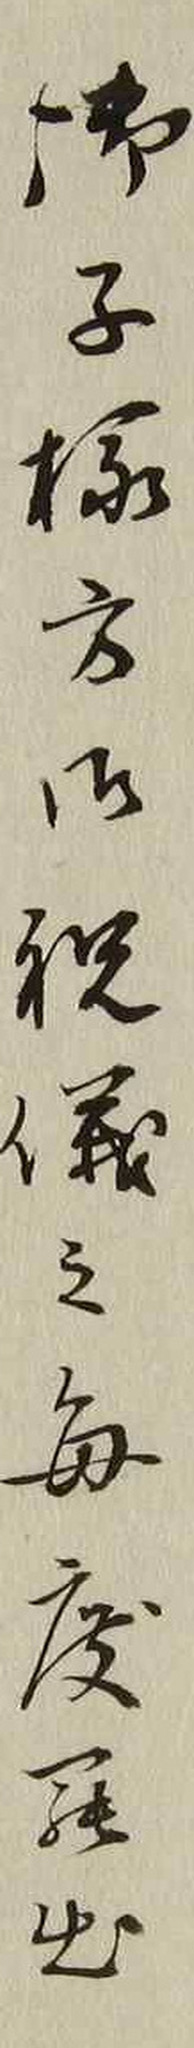御子様方御祝儀之毎度罷り出で
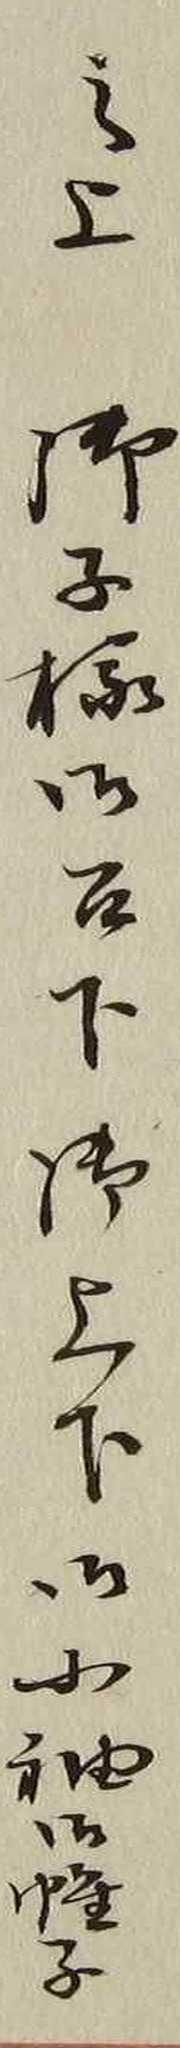之上御子様御召し下げ御上下御小袖御帷子
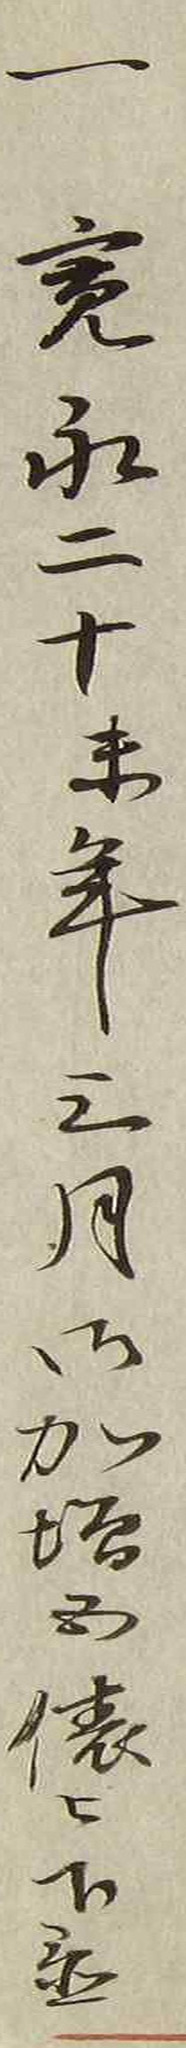一寛永ニ十未年三月御加増五俵下し置かれ

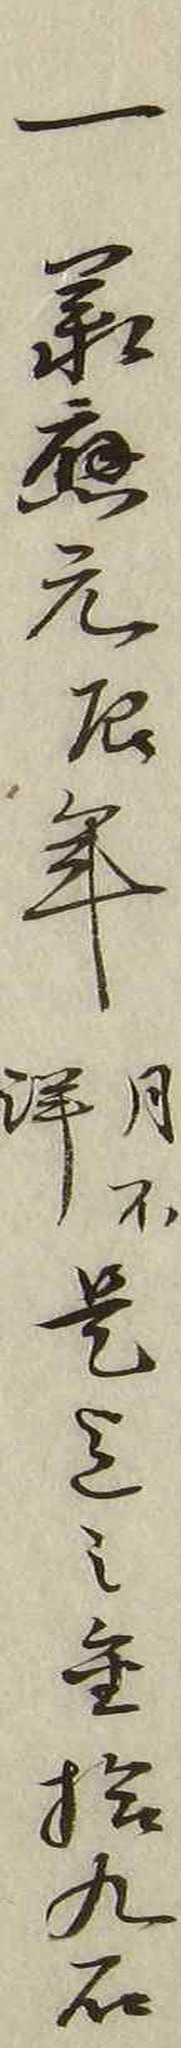一承応元辰年月不詳是迄之金拾九石
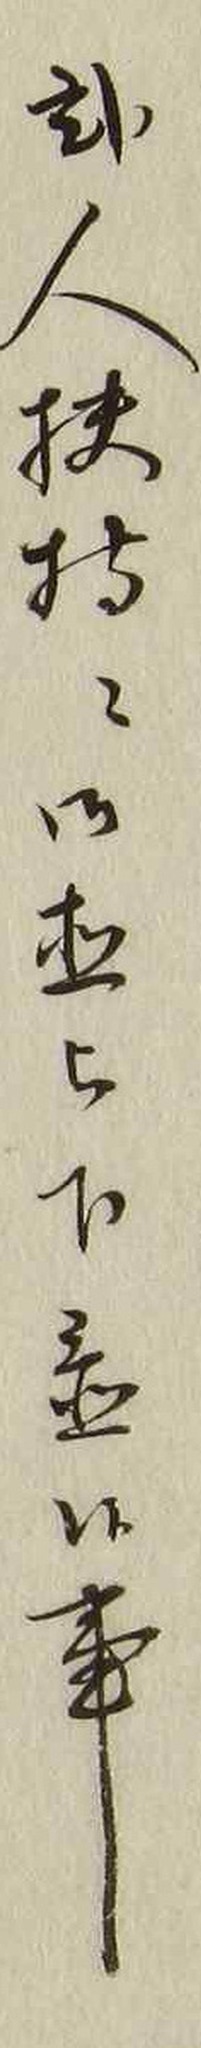弐人扶持ニ御直下し置かれ候事
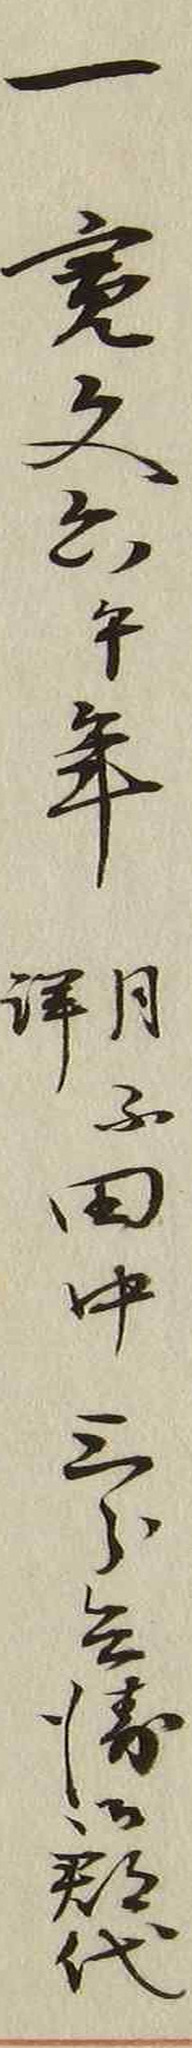一寛文六午年月不詳田中三郎兵衛御郡代
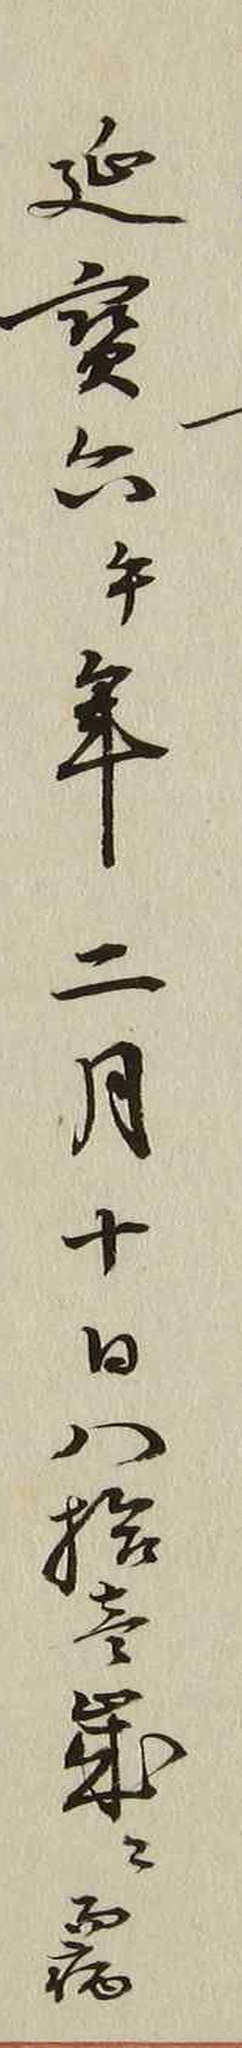一延宝六午年二月十日八拾壱歳ニて病
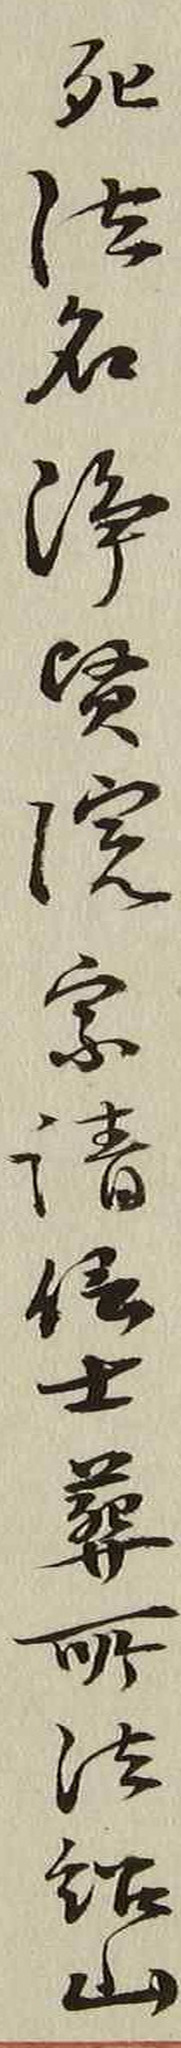死法浄賢院宗清信士葬所法紹山
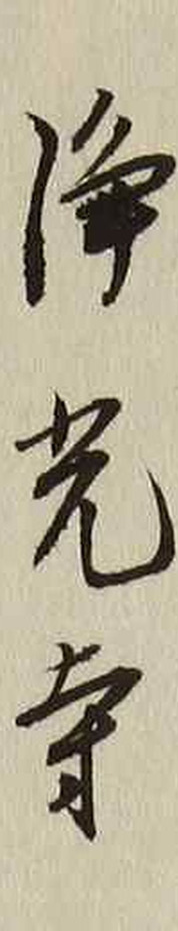浄光寺
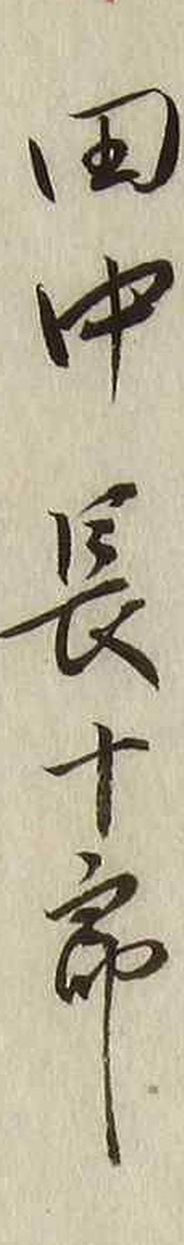田中長十郎
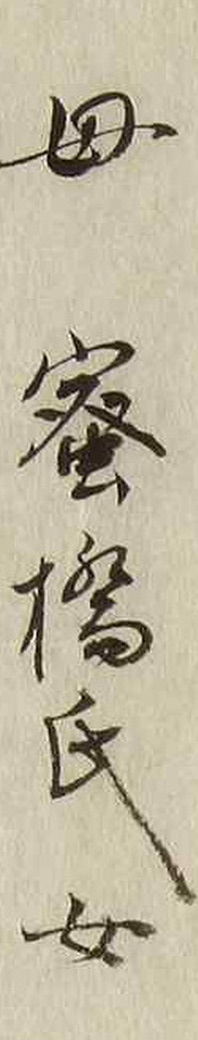母密橋氏女

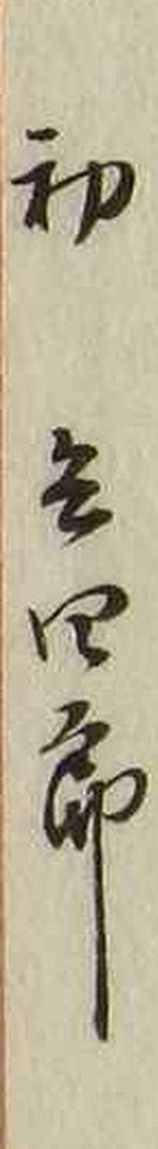初兵四郎
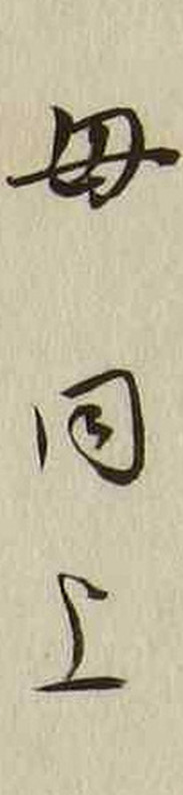母同上
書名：諸士系譜　巻之16　い之部16
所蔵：会津若松市立会津図書館
